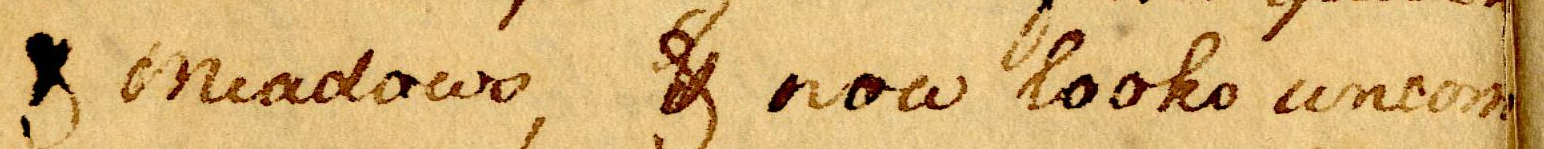& meadows, & now looks uncom
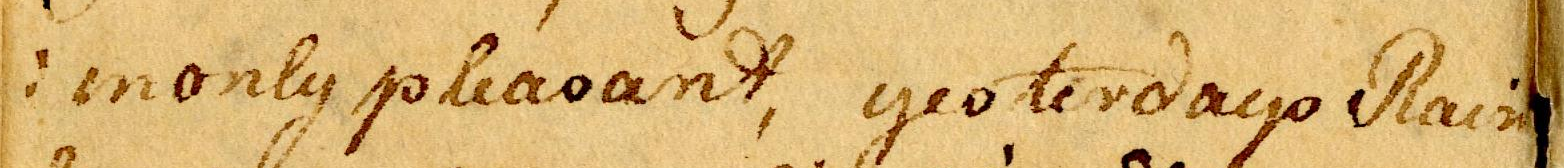-monly pleasant, yesterdays Rain
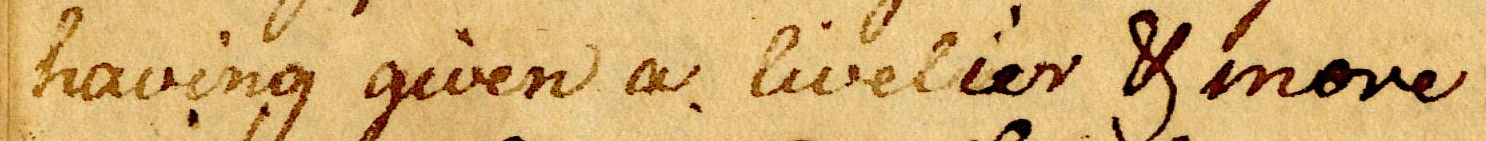having given a livelier & more
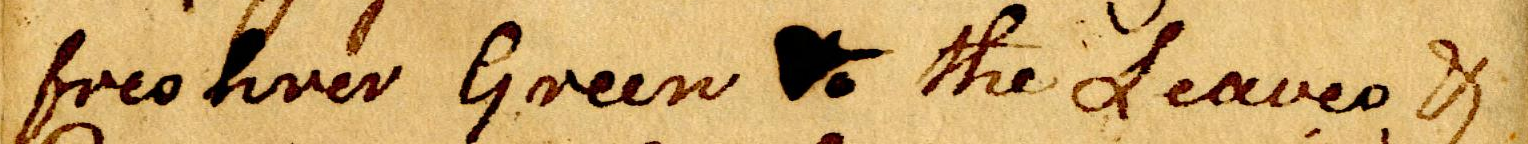freshrer Green to the Leaves &
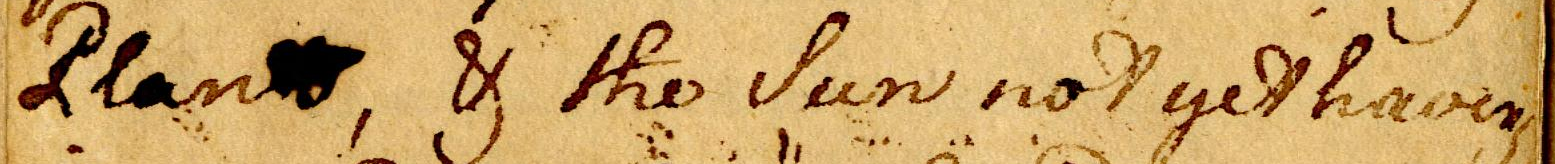Plants, & the Sun not yet having
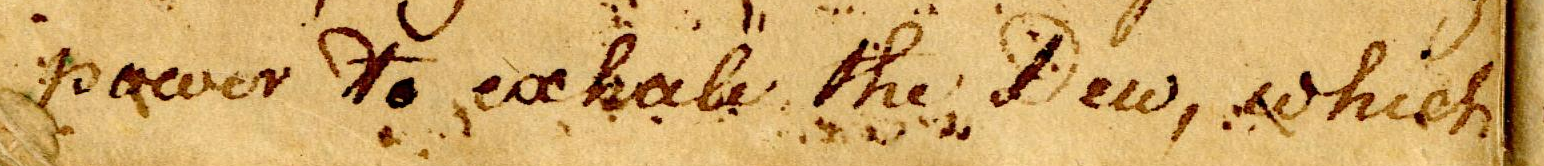power to exhale the Dew, which
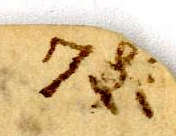73
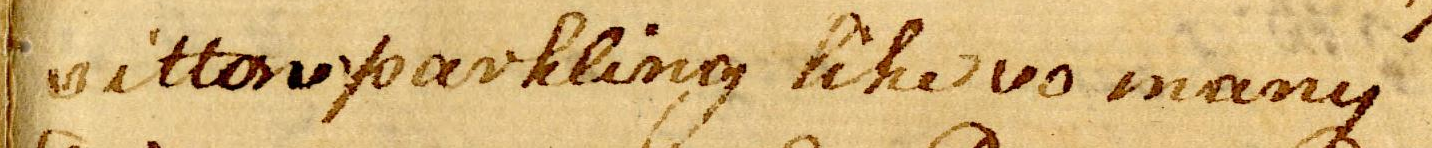sitton sparkling like so many
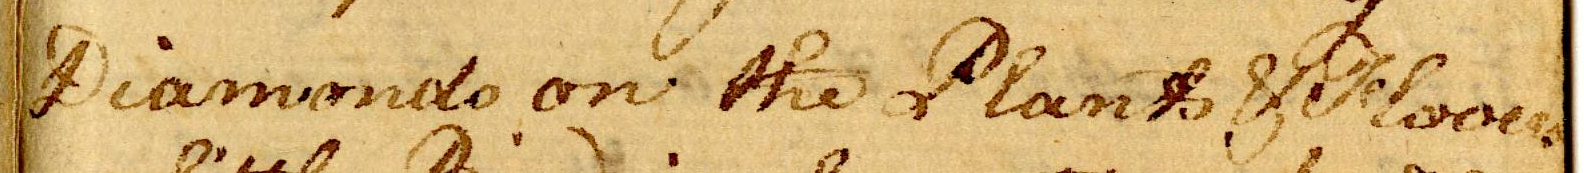Diamonds on the Plants & Flowers
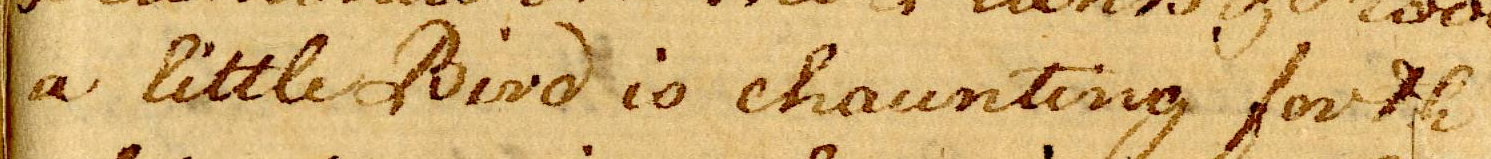a little Bird is chaunting forth
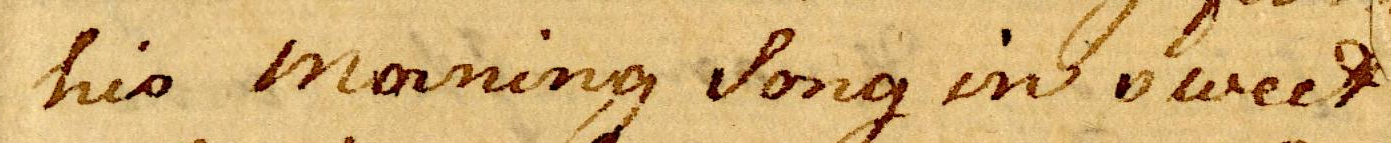his Morning Song in sweet
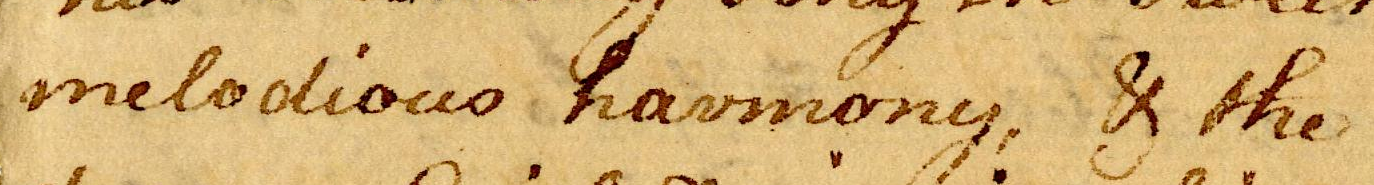melodious harmony, & the
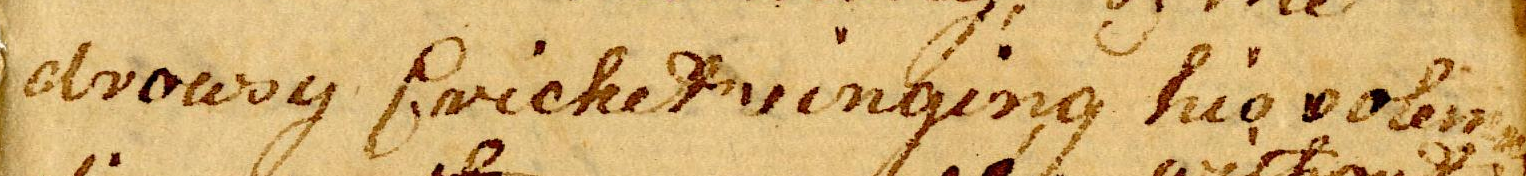drowsy Cricket singing his solemn
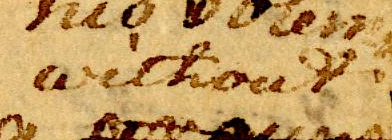without
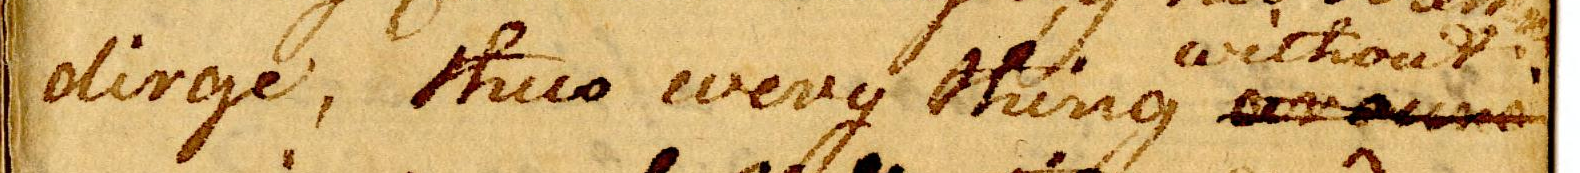dirge, thus every thing anxious
